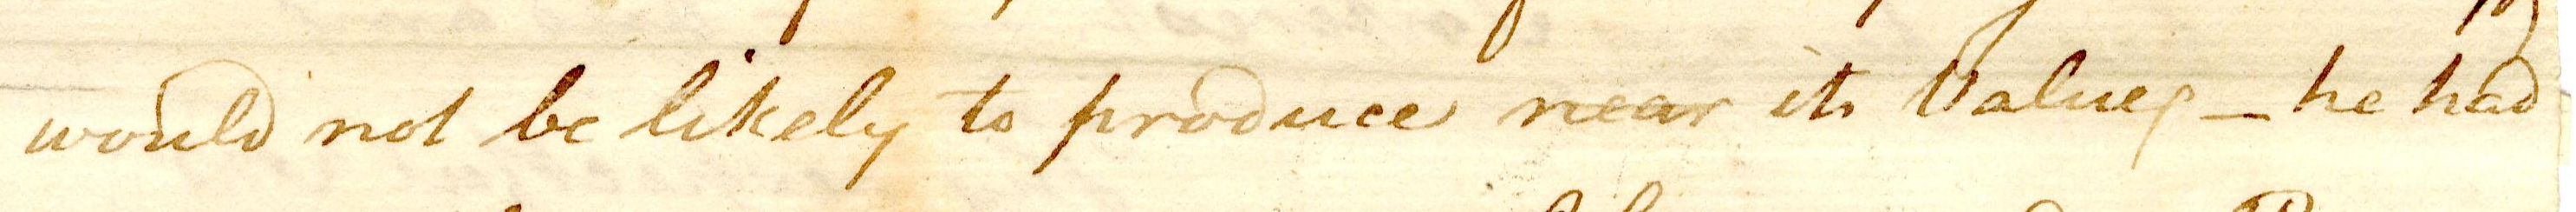would not be likely to produce near its Value. he had
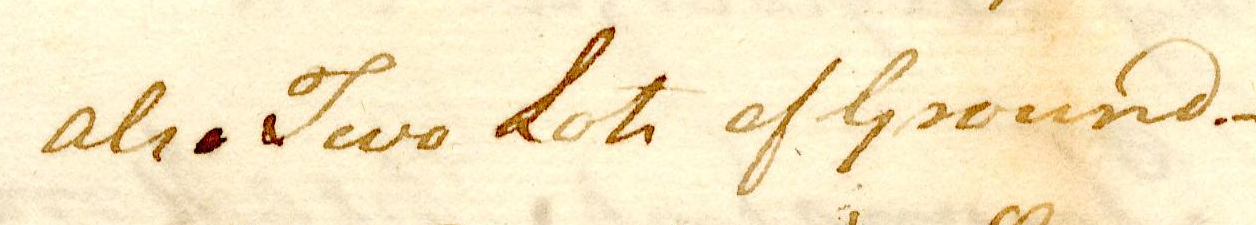also Two Lots of Ground....
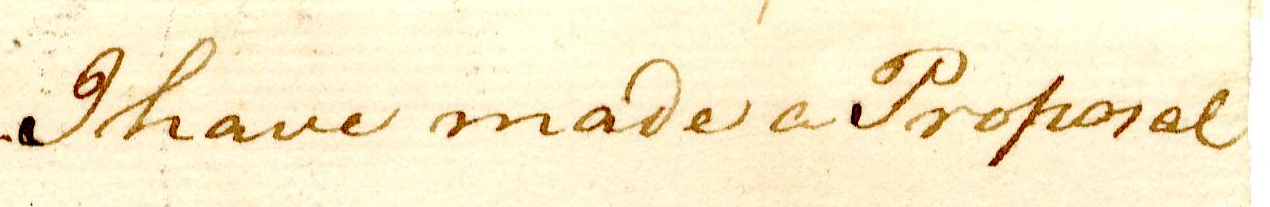I have made a Proposal
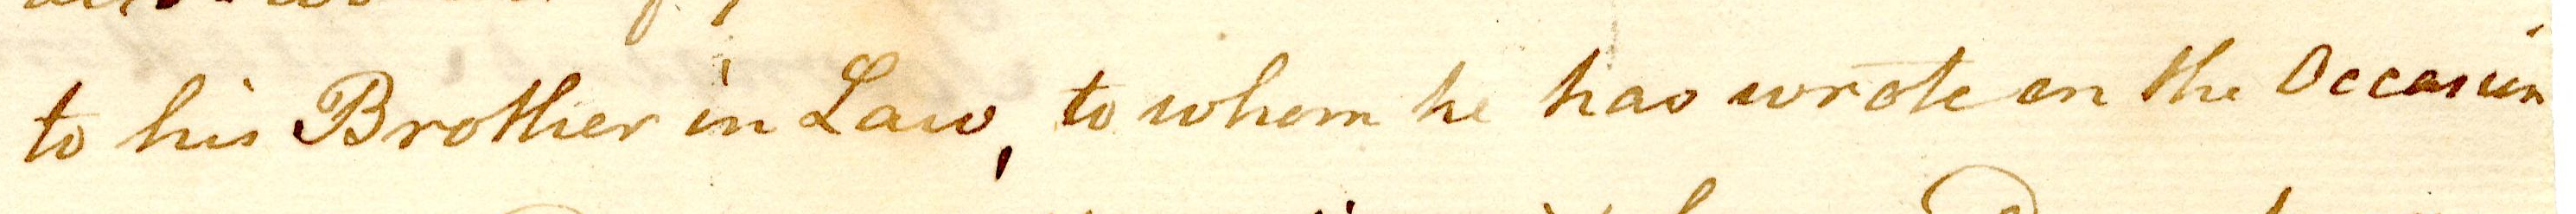to his Brother in Law, to whom he has wrote on the Occasion
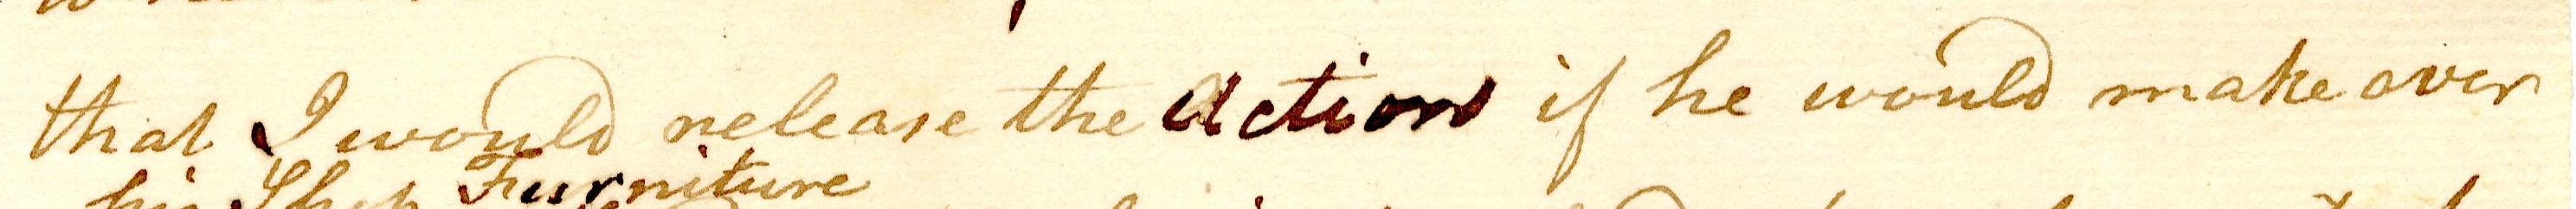that I would release the Actions if he would make over
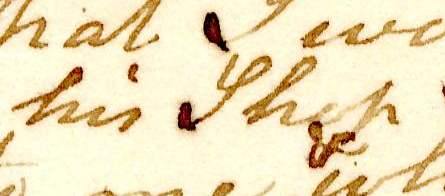his Shop
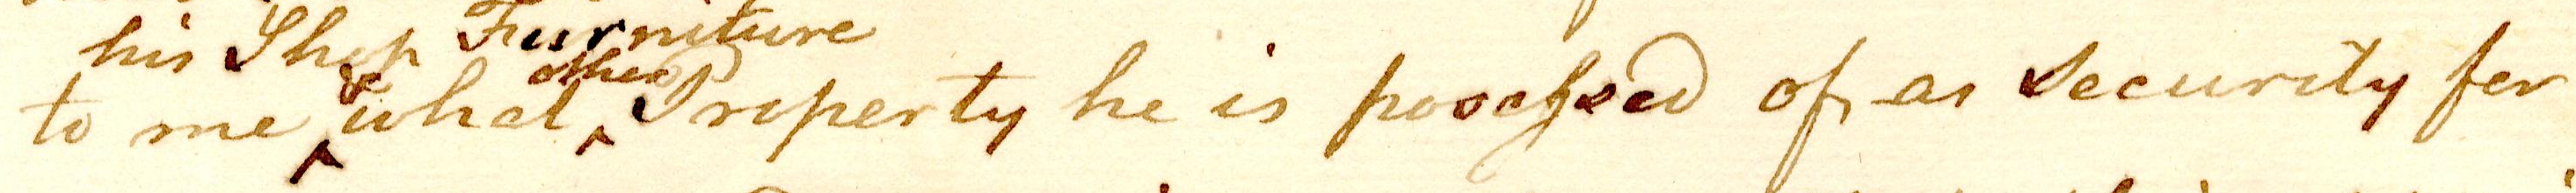to me ^ what ^ Property he is posessed of as security for
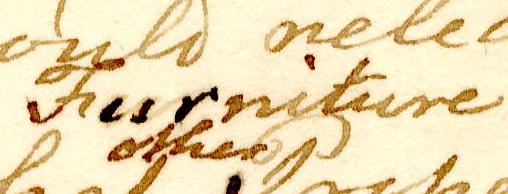Furniture
